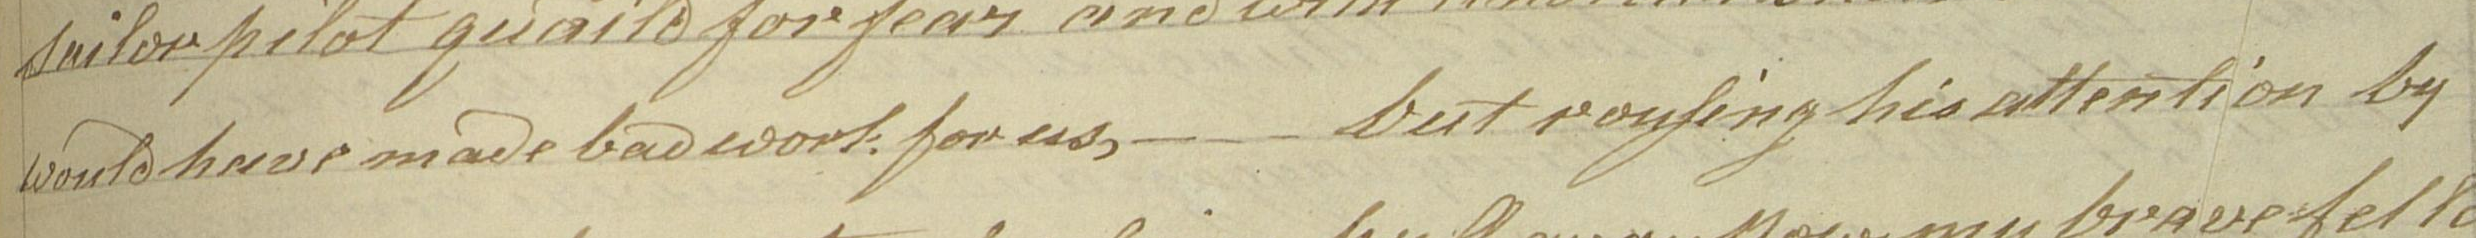would have made bad work for us, but rousing his attention by
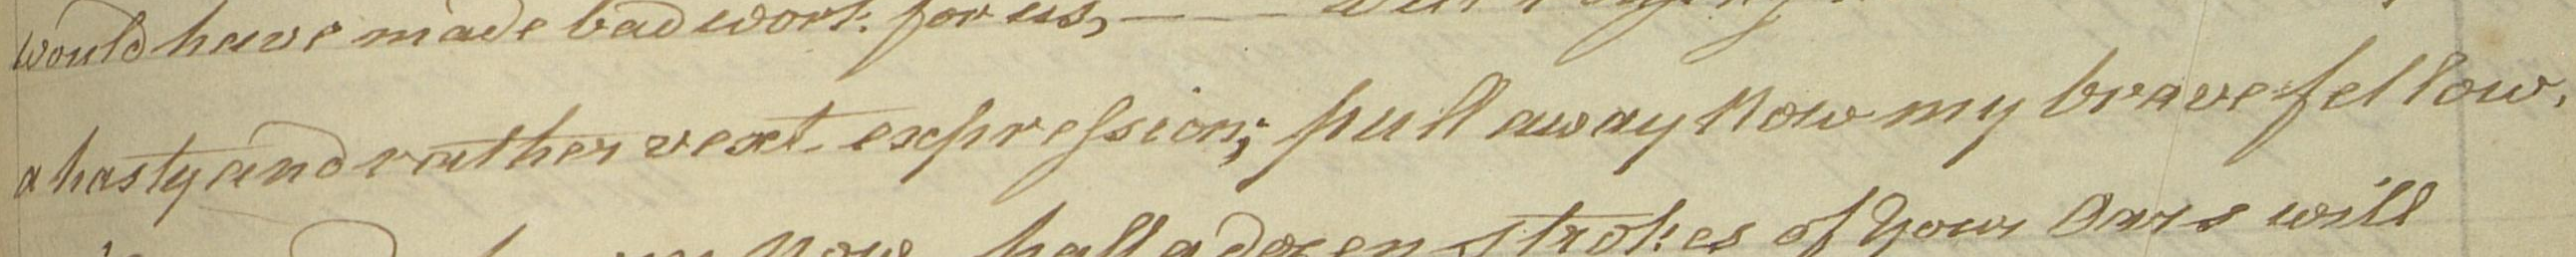a hasty and rather vext expression; pull away Now my brave fellow
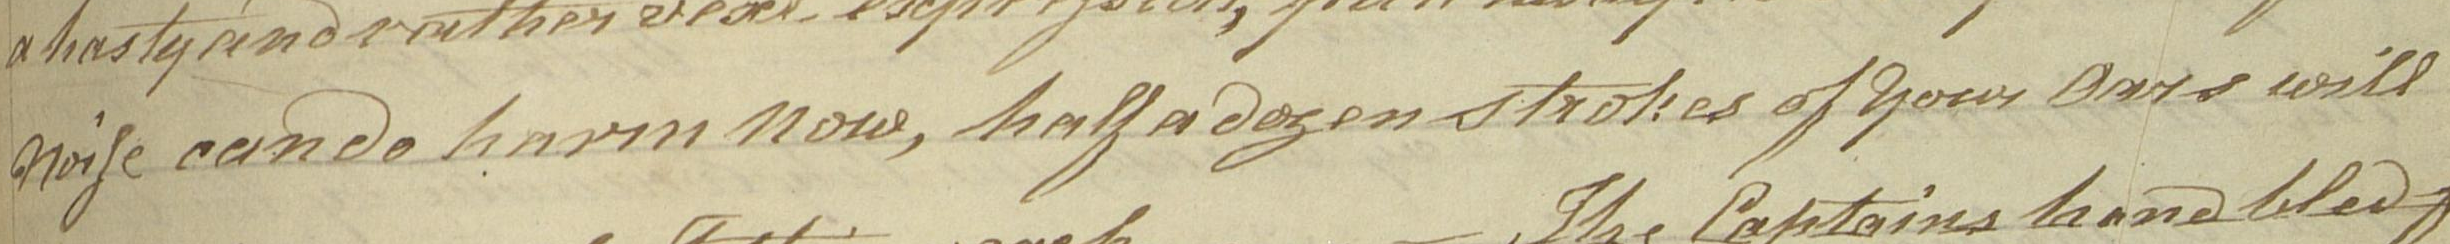noise can do harm now, half a dozen strokes of your Oars will
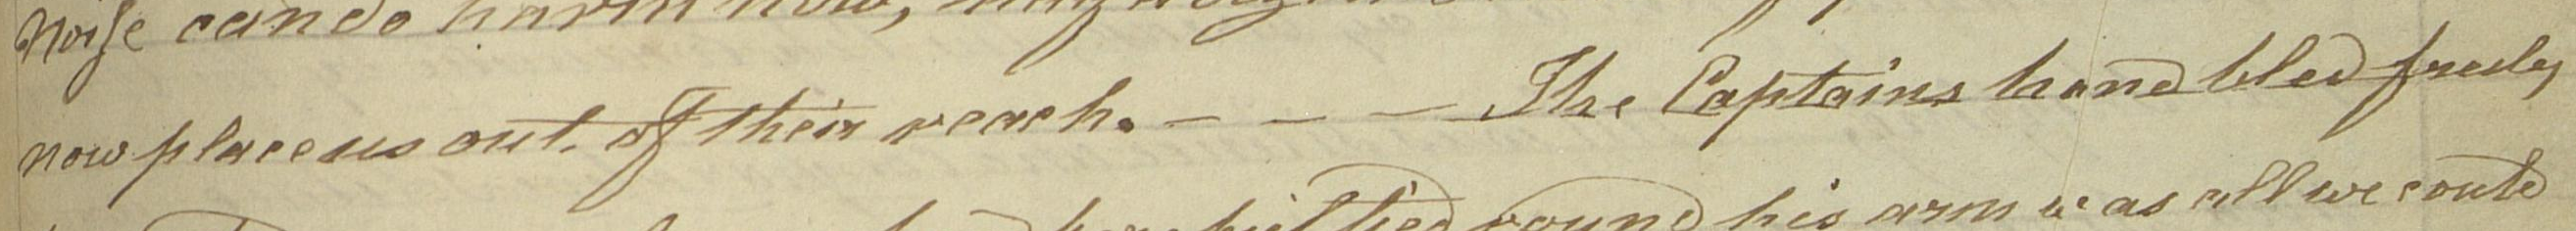now place us out of their reach. The Captains hand bled freely
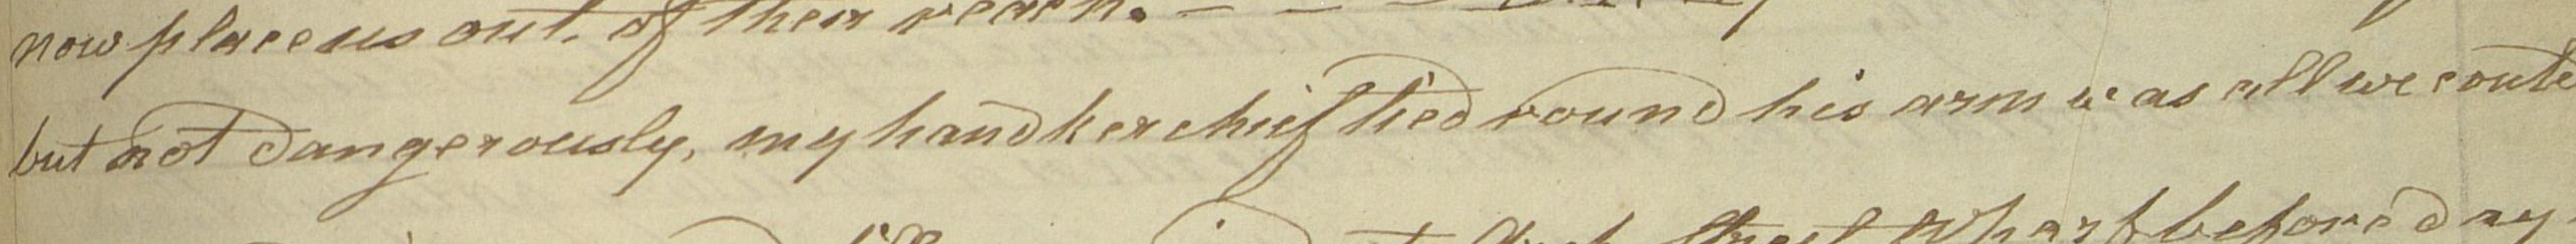but not dangerously my handkerchief lied round his arms was at all we could
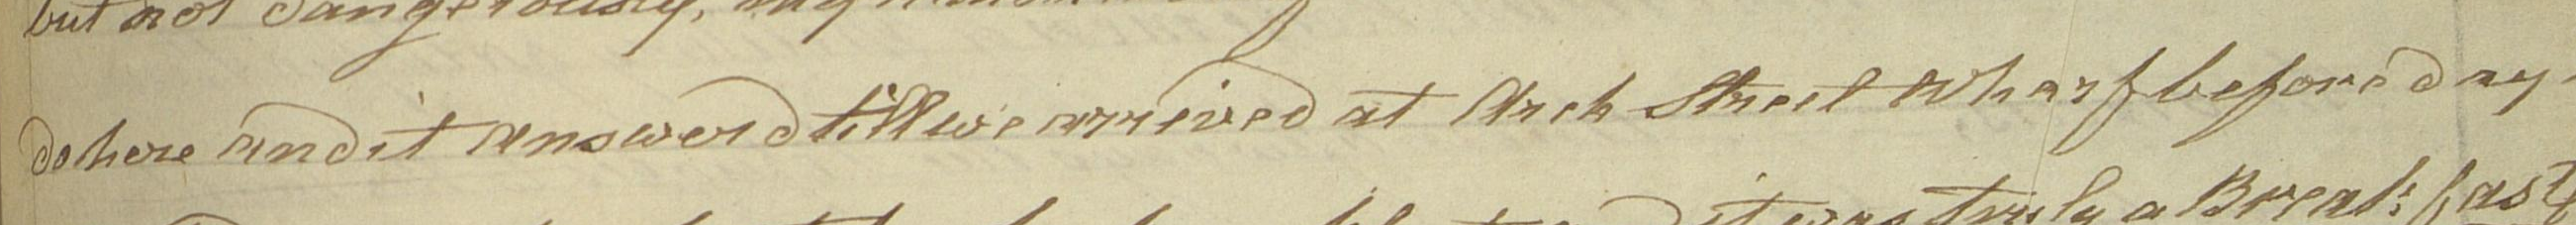where and it answered till we arrived at Arch Street Wharf before day
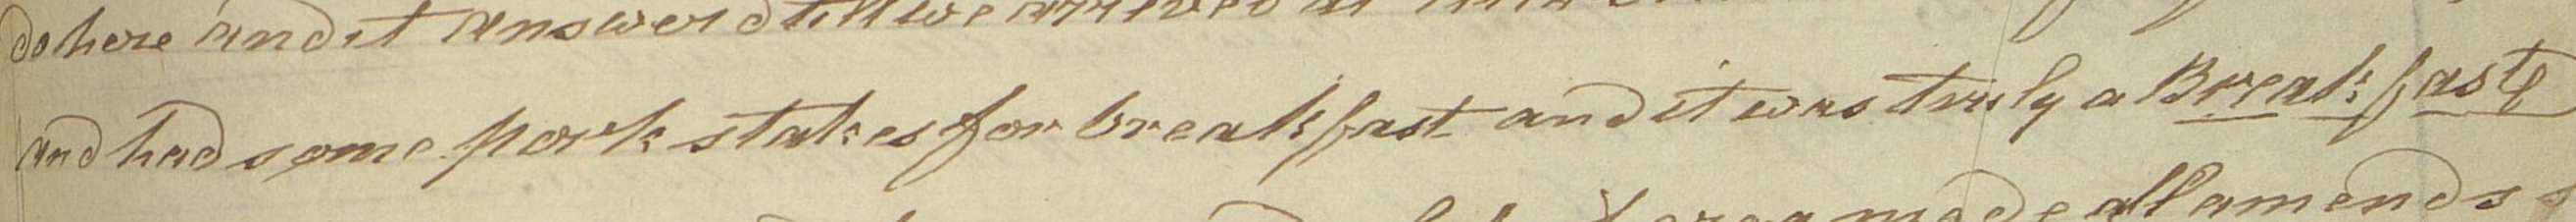and had some pork stakes for breakfast and it was truly a Breakfast
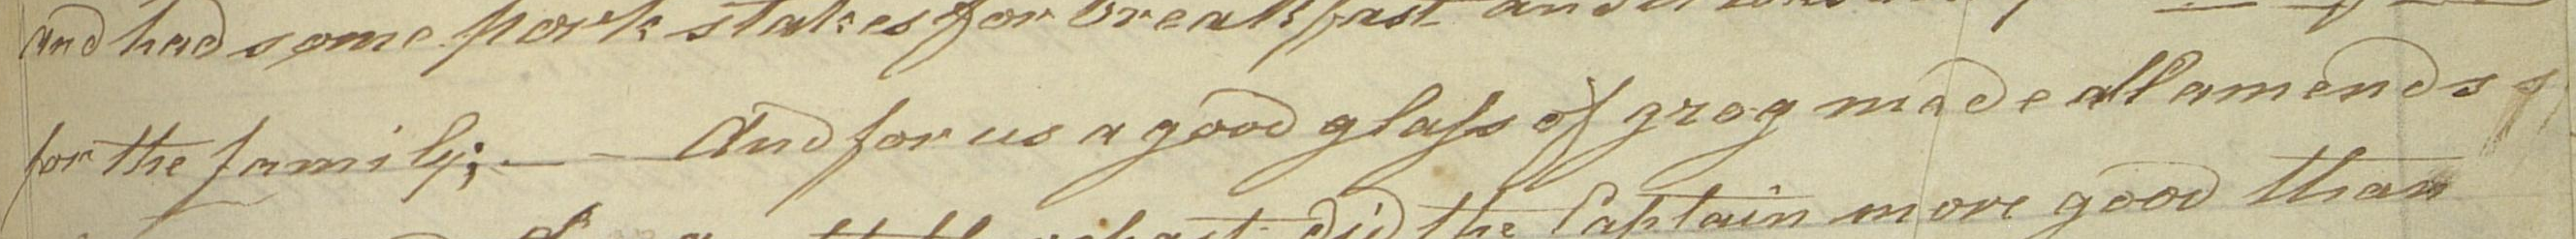for the family; And for us a good glass of grog made all amends
